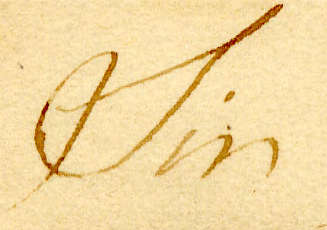Sir
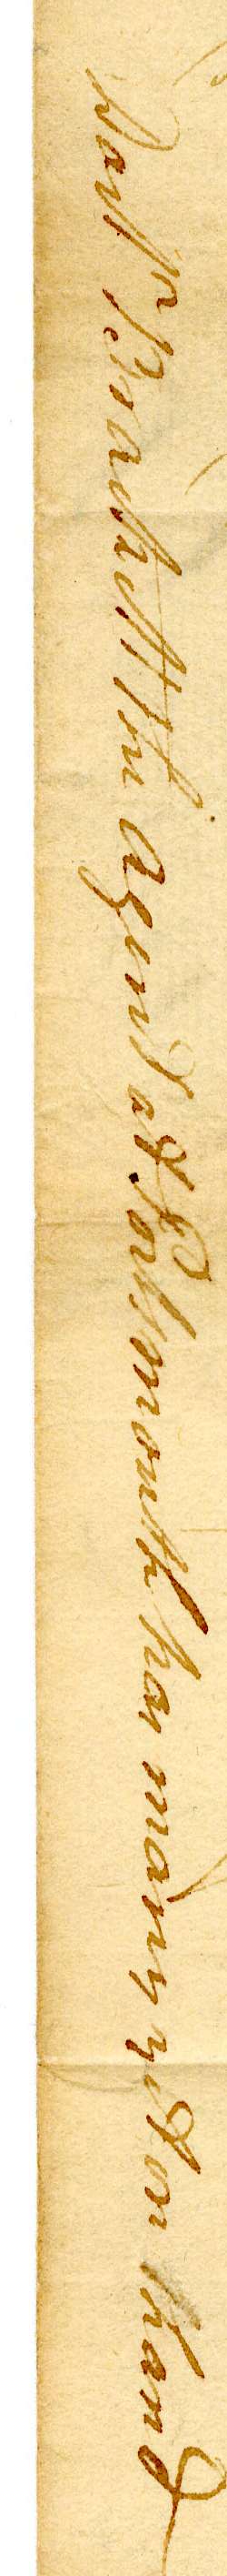Danl Brackett the agent at Portsmouth has many yet on hand
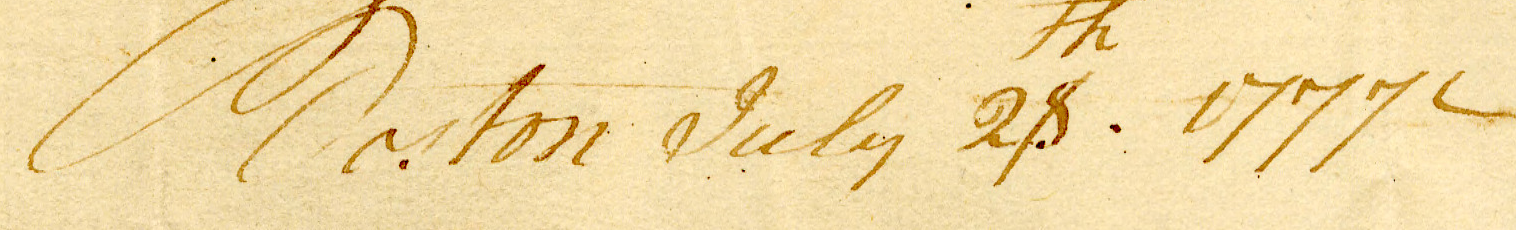Boston July 28^th. 1777
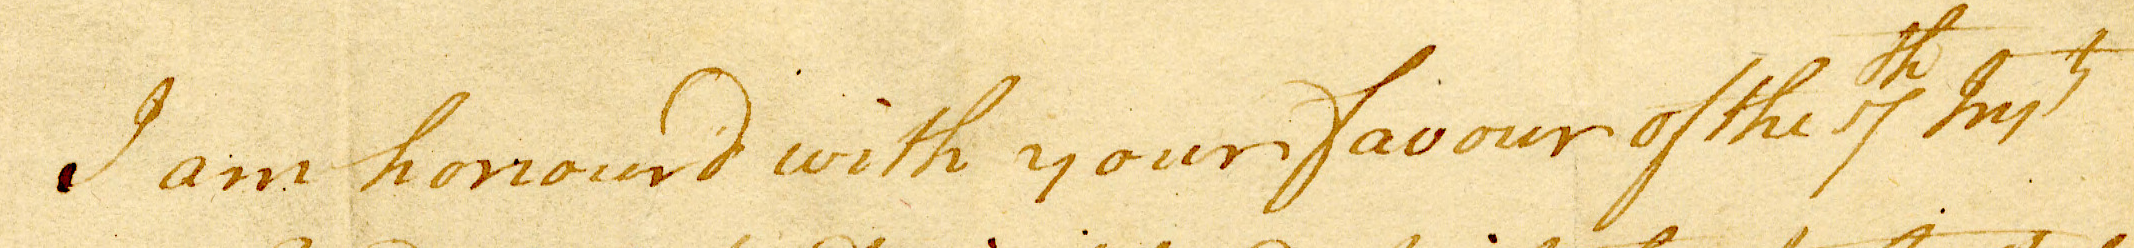I am honourd with your favor of the 7^th Ins^t
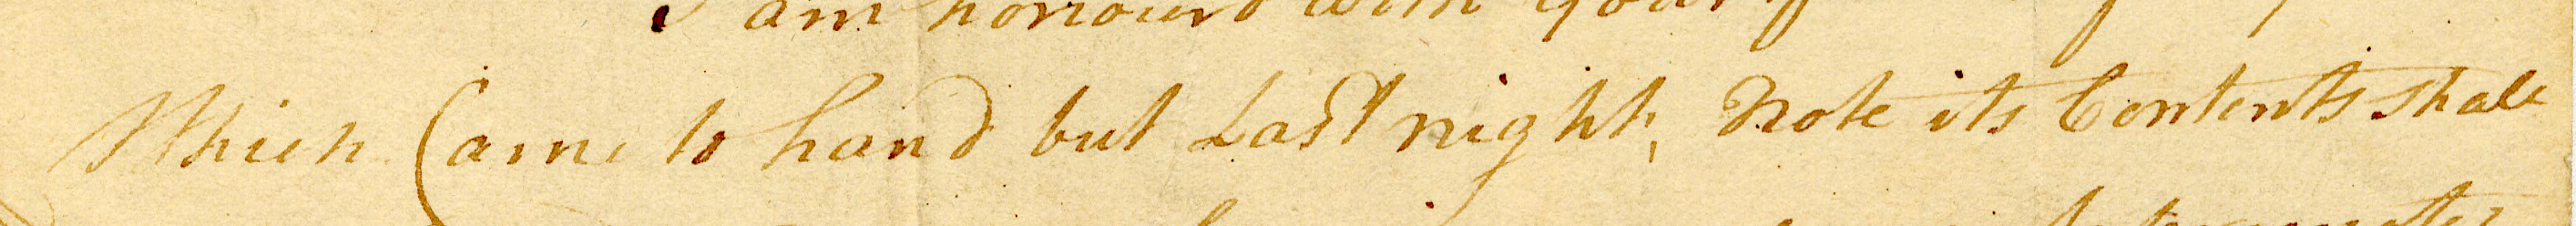Which Came to hand but Last night, note its Contents shall
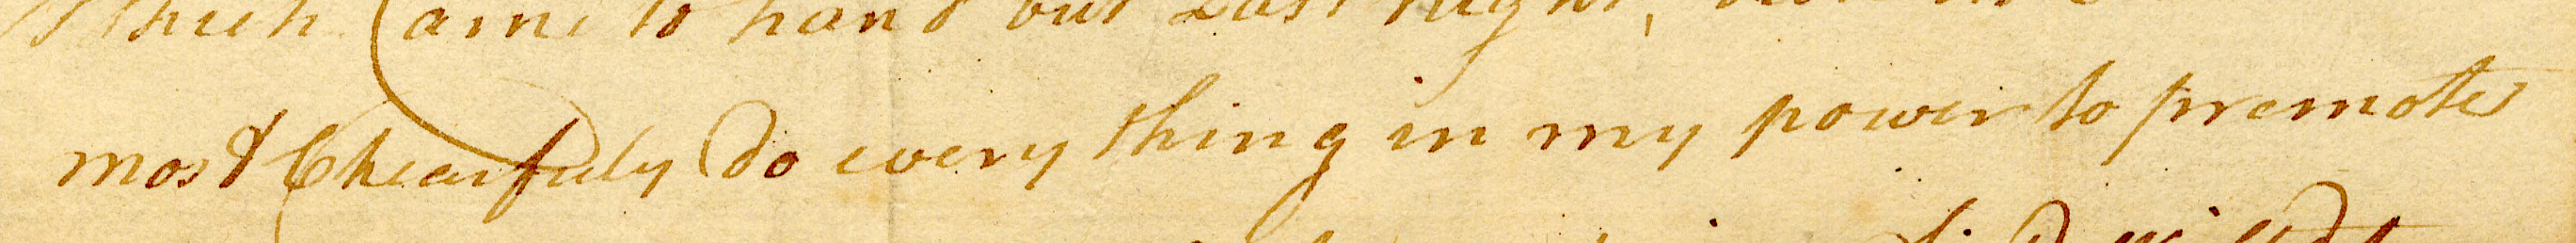most chearfuly do every thing in my power to promote
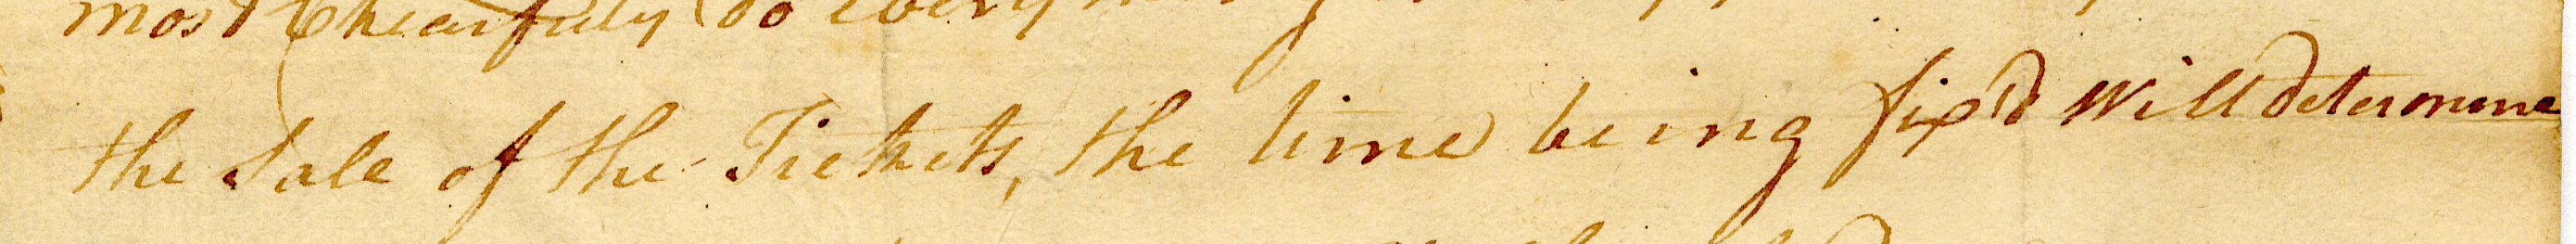the sale of the Tickets, the time being fix'd will determine
